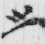之
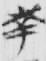南
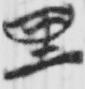里
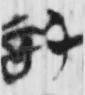○（信）
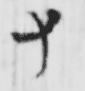又（有）
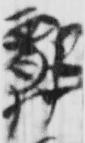龔
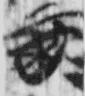栖栖
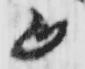㠯（以）
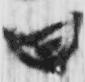甘
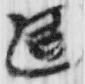固
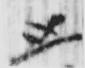之
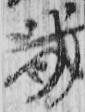歲（歲）
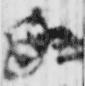爲
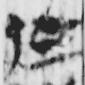於
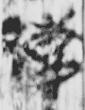喜
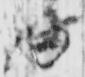居
